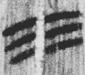三
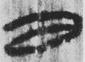日
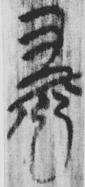耑（端）
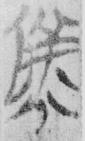備（服）
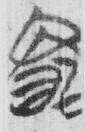{冒乇}（曼）
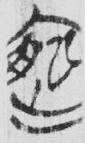{俞止}（辶俞）
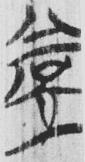堂（當）
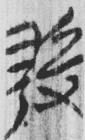○（楣）
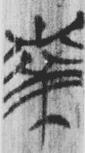南
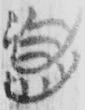面
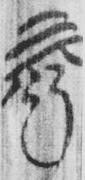而
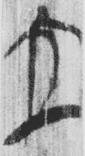立
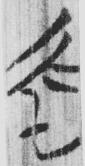帀（師）
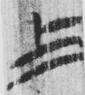上（尚）
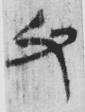父
